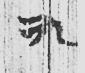九
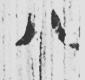八
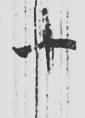七
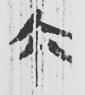六
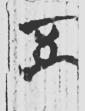五
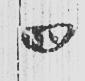四
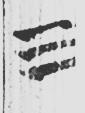三
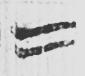二
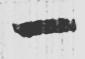一
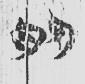刖
